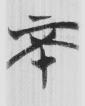不
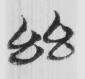𢆶
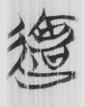達
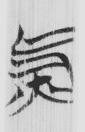{气火}
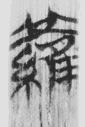羅
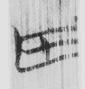甲
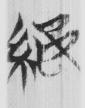{糸口女}
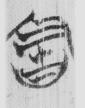{冃由}
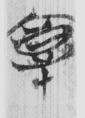{亯羊}
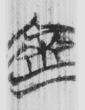齊
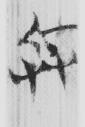兵
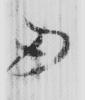刃
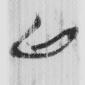㠯（以）
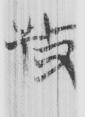{干攴}
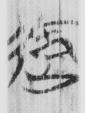御
